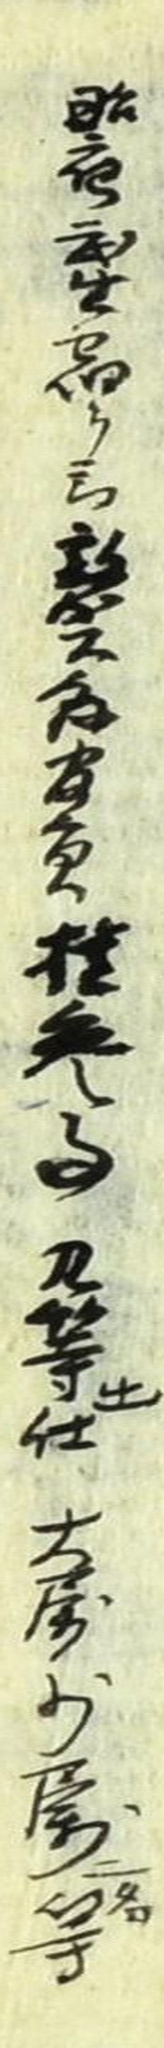昨夜武生宿リニ而敦賀県官員権参事九等出仕大属少属二名等
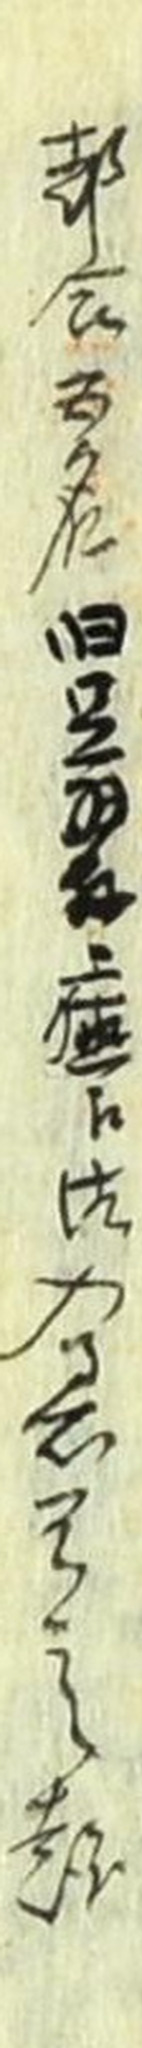都合五名旧足羽県庁江御入着有之趣
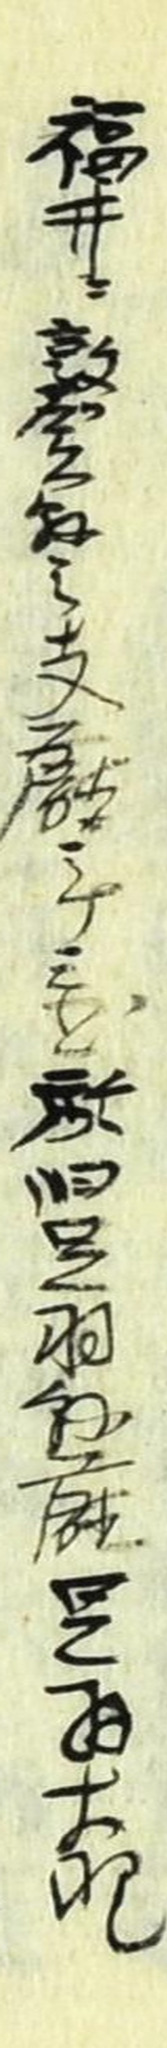福井ニ敦賀県之支庁ヲ置於旧足羽県庁足羽大野
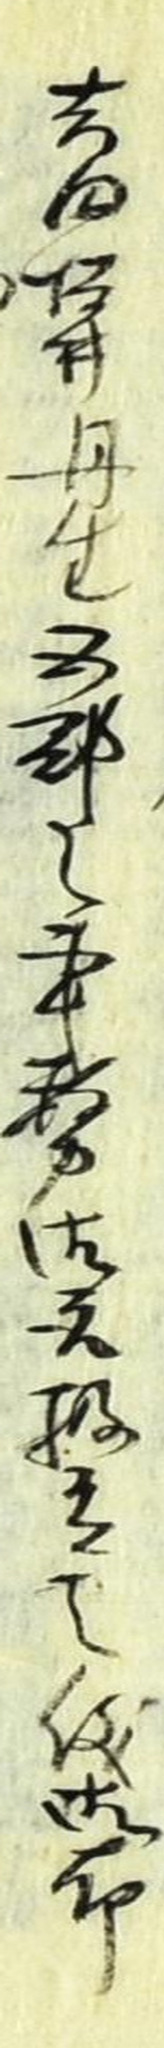吉田坂井丹生五郡之事務御取扱有之儀御布
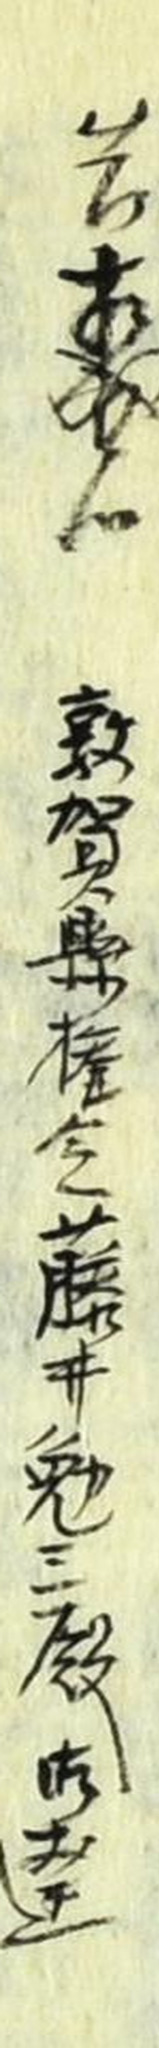告相成候敦賀県権令藤井勉三殿御達

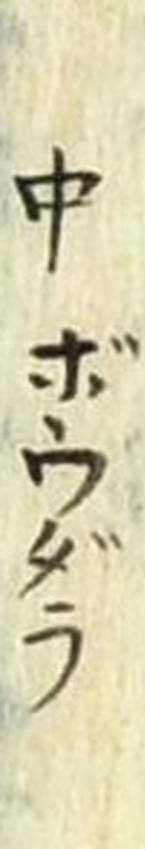中ボウダラ
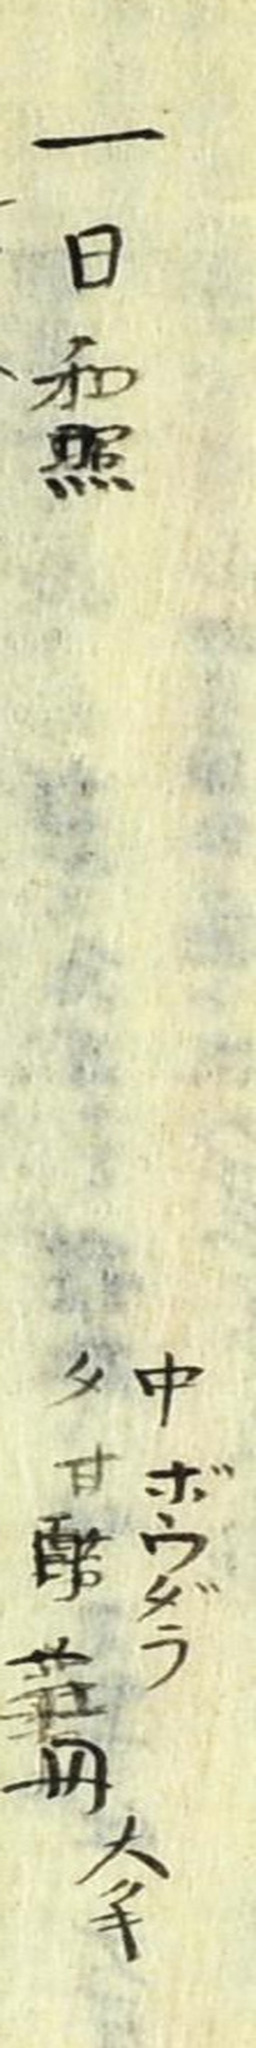一日和照夕甘酷荘丹大クキ
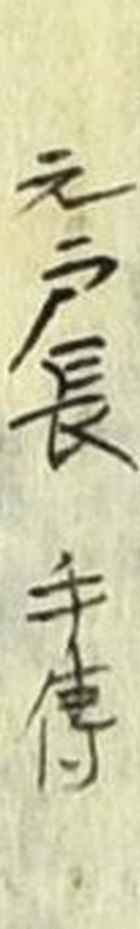元戸長手伝
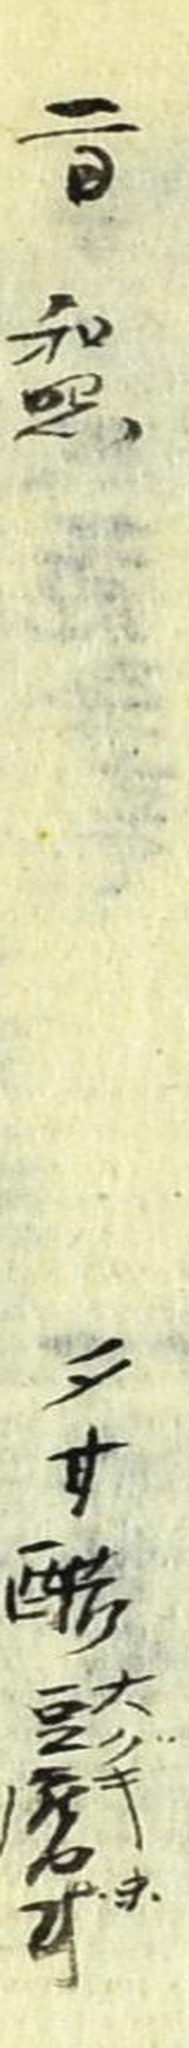二日和照夕甘酷豆腐汁
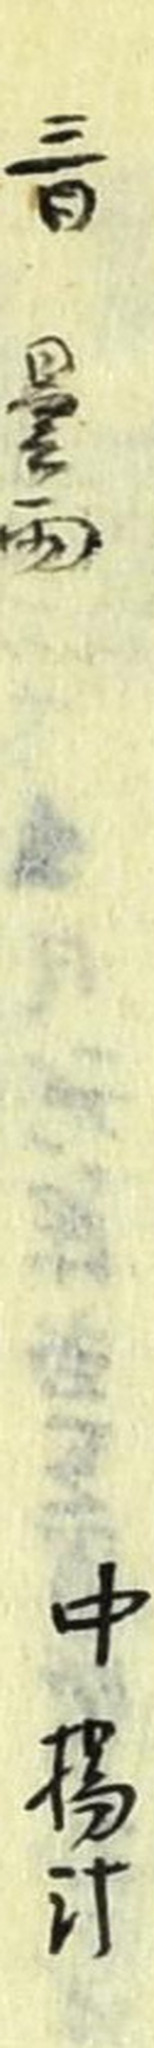三日曇雨中揚汁
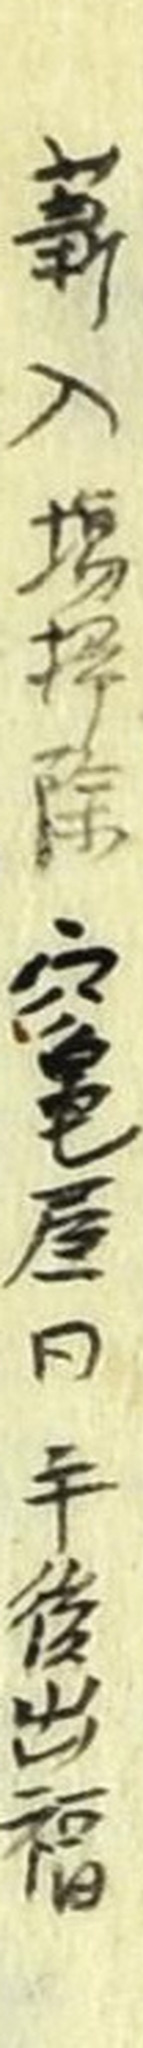薪入場掃除竈屋同午後出福
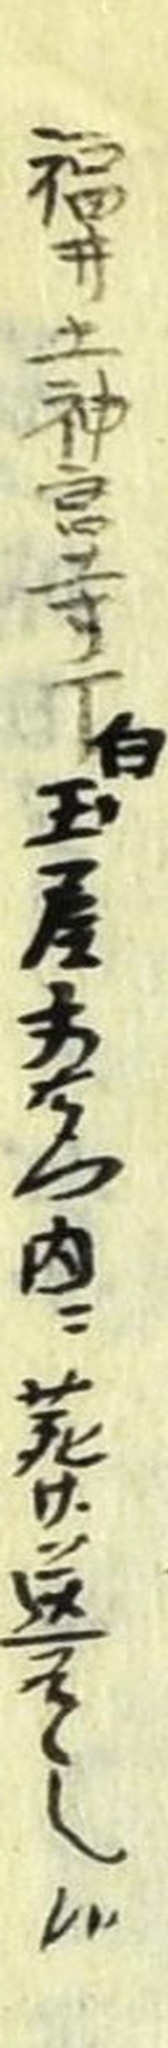福井土神宮寺丁白玉屋丈右衛門内ニ葬送有之候
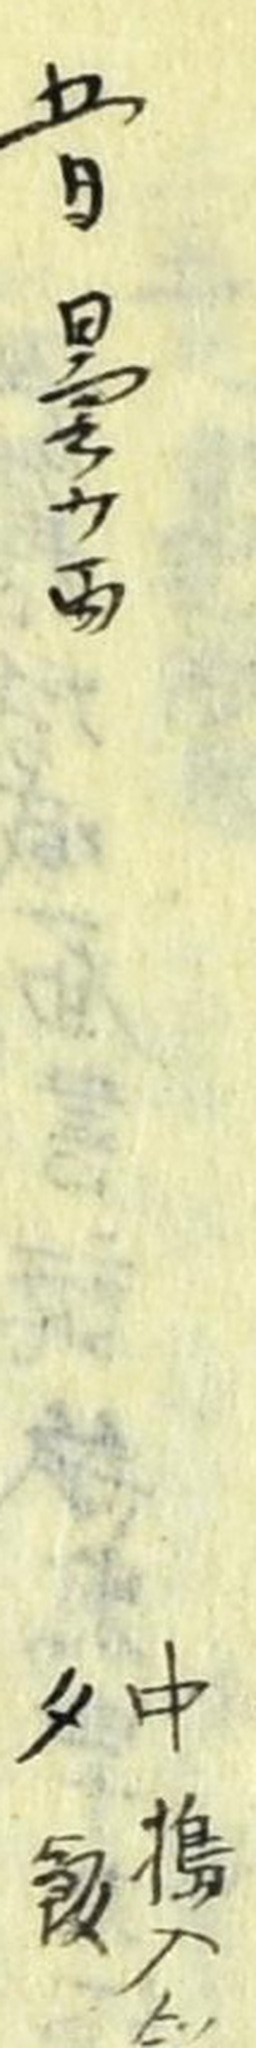五日曇少雨夕飯
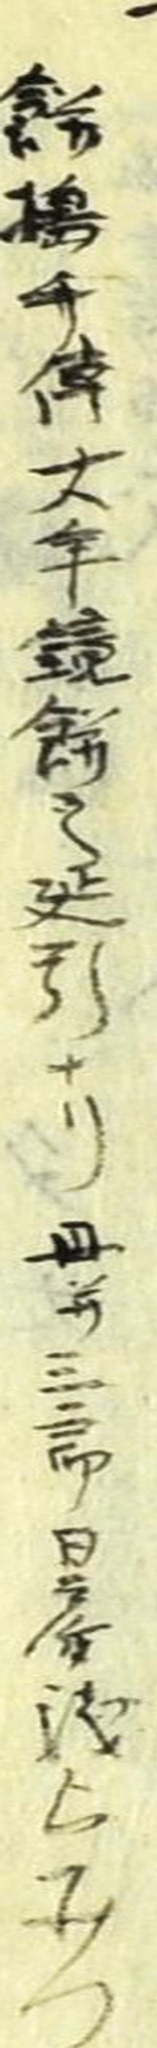餅搗手伝大年鏡餅之延引ナリ母幷三郎日雇浅右衛門みつ
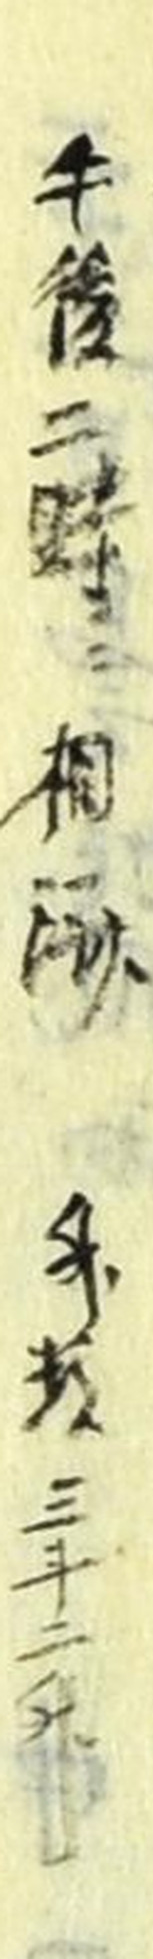午後二時ニ相済升数三斗二升
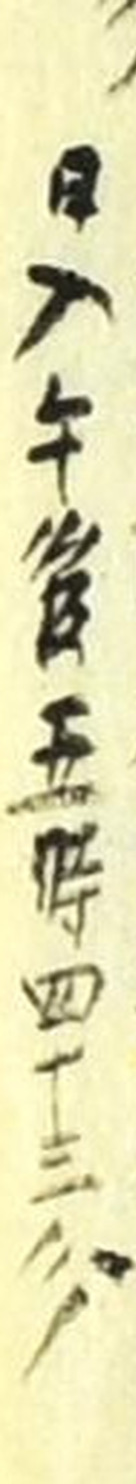日入午後五時四十三分
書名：（日記）
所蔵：福井県文書館 Fukui Prefectural Archives
